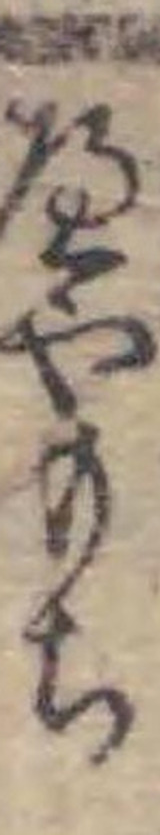へやもち
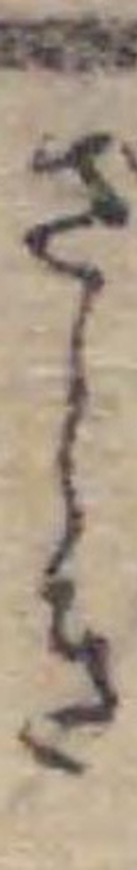ざしき
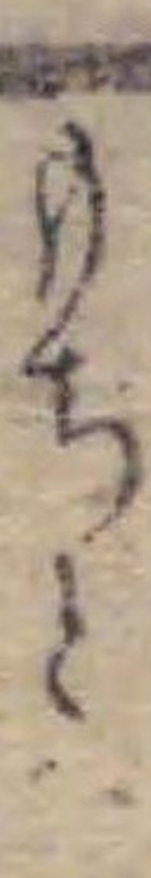もちと
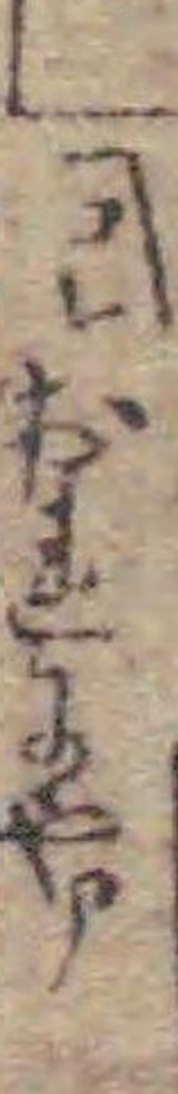〽コレおれにやァ
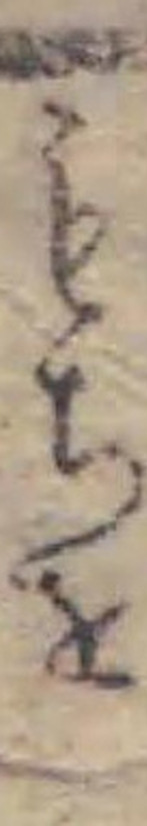もちを
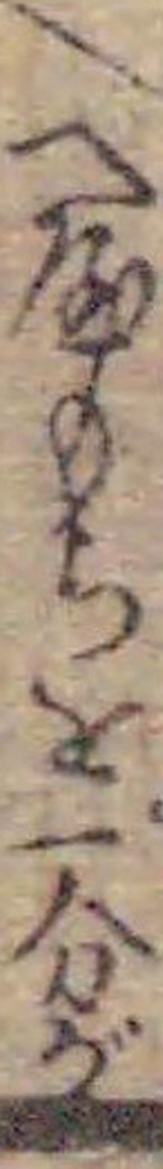へやもちを一分が
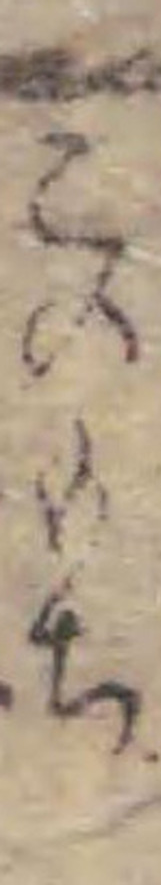このもち
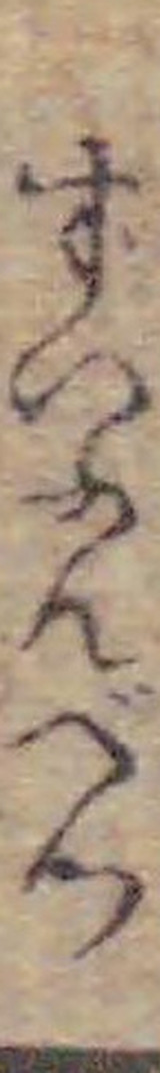ずいふんべつ
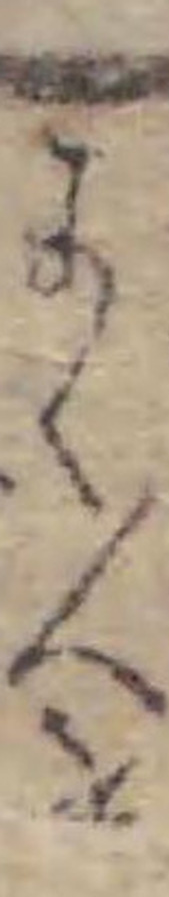よく人を
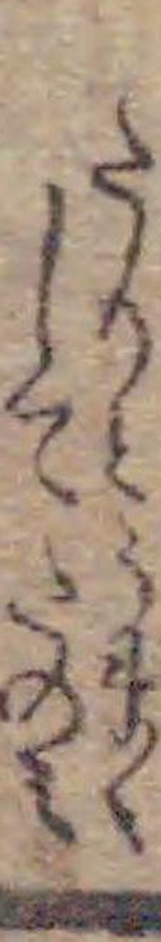たりとうまく
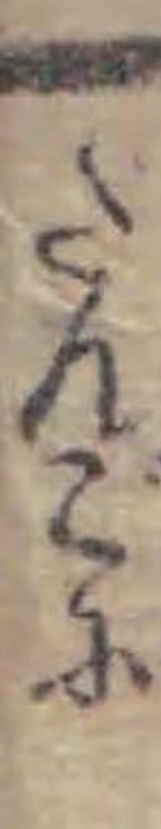たんごふ
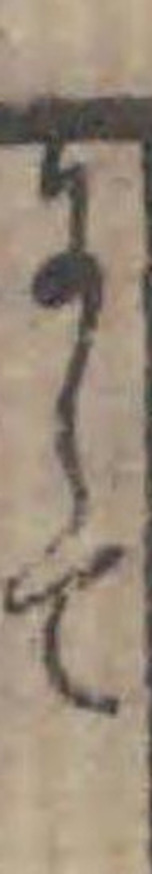にして
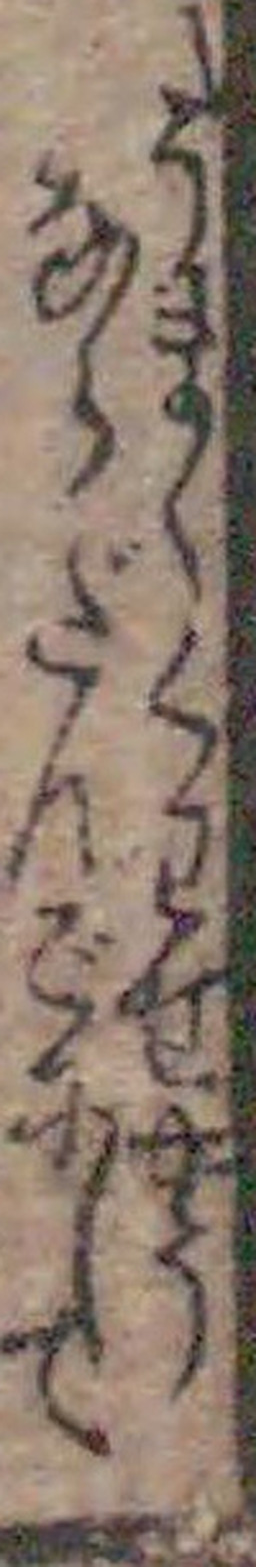ならだんごにして
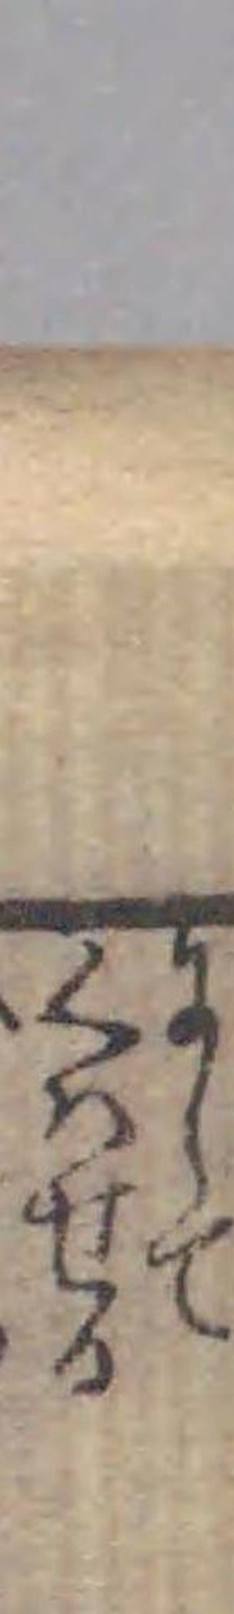くはせる
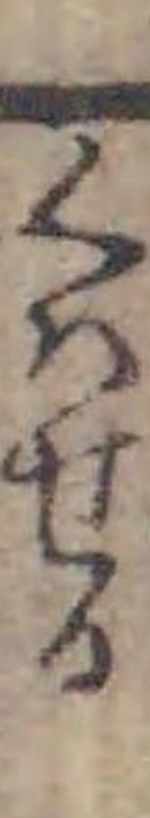くはせる
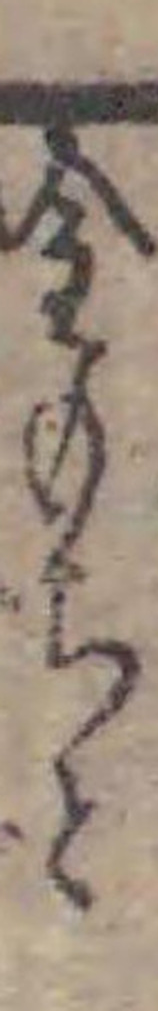金もちと
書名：北国順礼唄方便 : 3巻
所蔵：国立国会図書館 National Diet Library, JAPAN
